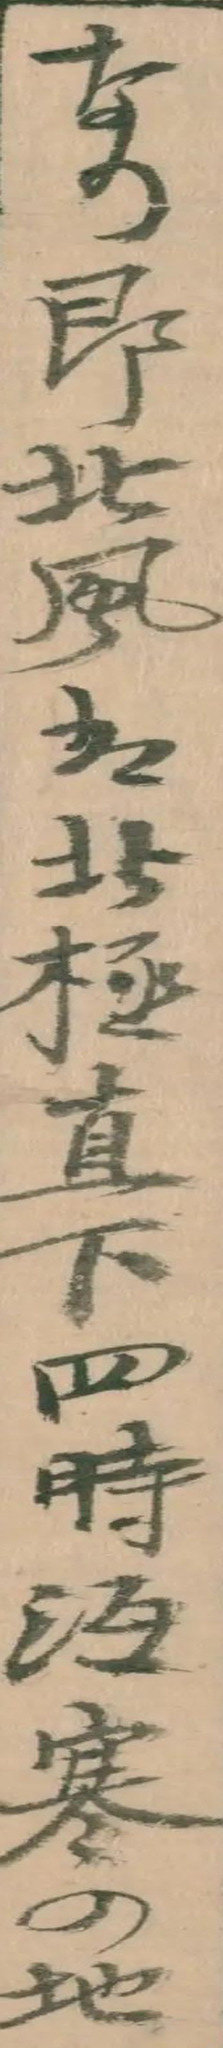なり即北風は北極直下四時沍寒の地
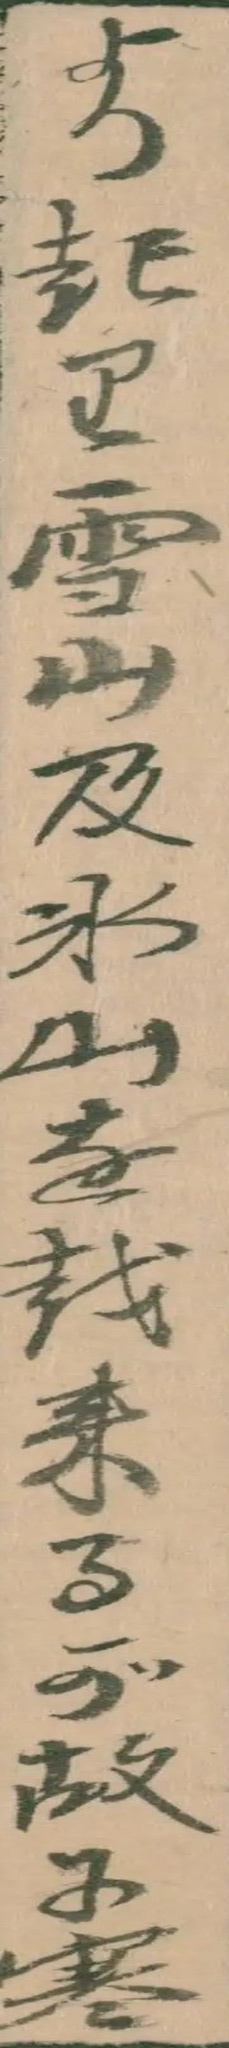より起り雪山及氷山を越来るが故に寒
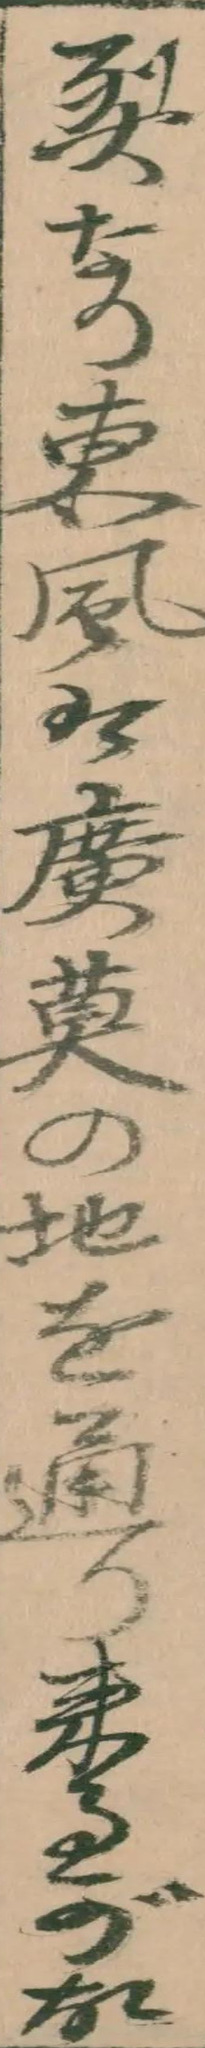烈なり東風は広莫の地を通り来るが故
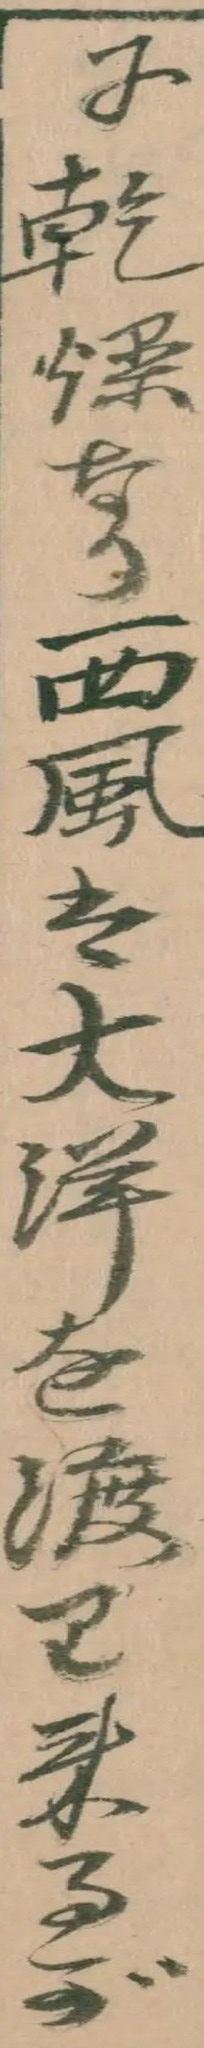に乾燥なり西風は大洋を渡て来るが
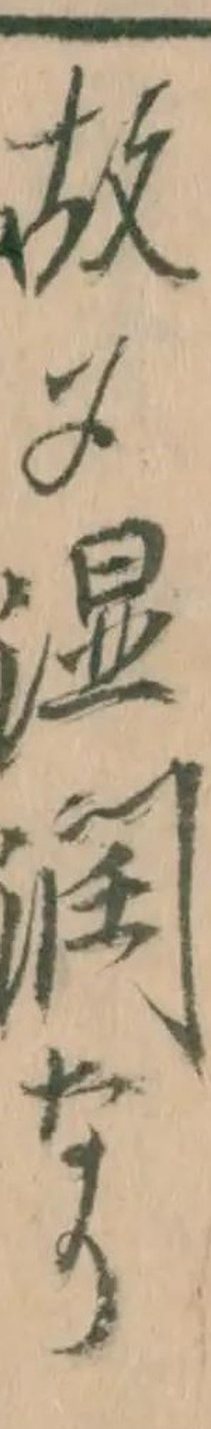故に湿潤なり
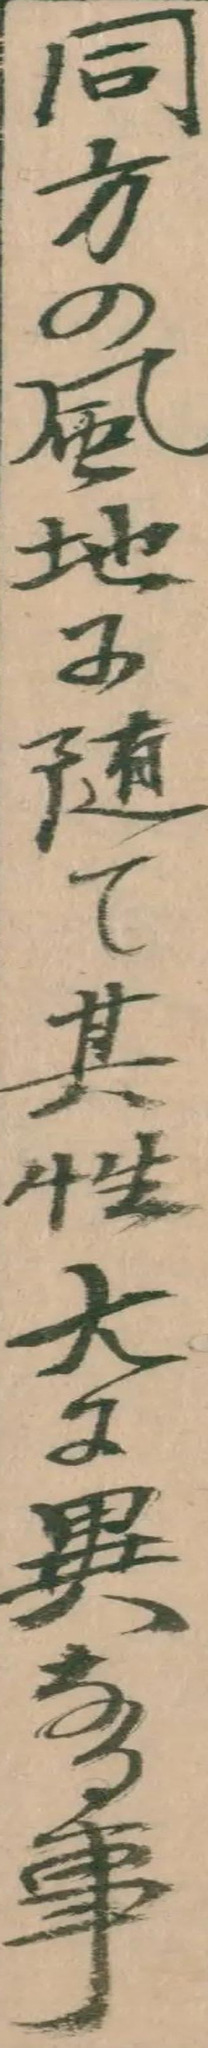同方の風地に随て其性大に異なる事
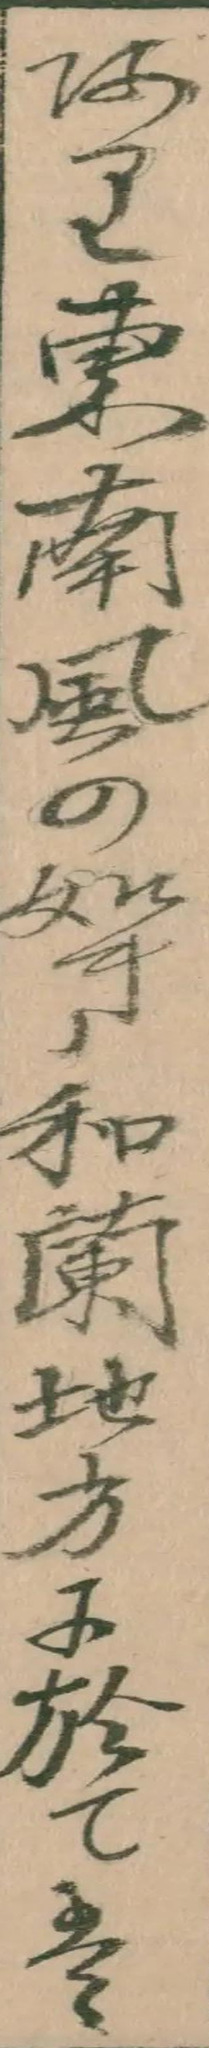あり東南風の如き和蘭地方に於ては
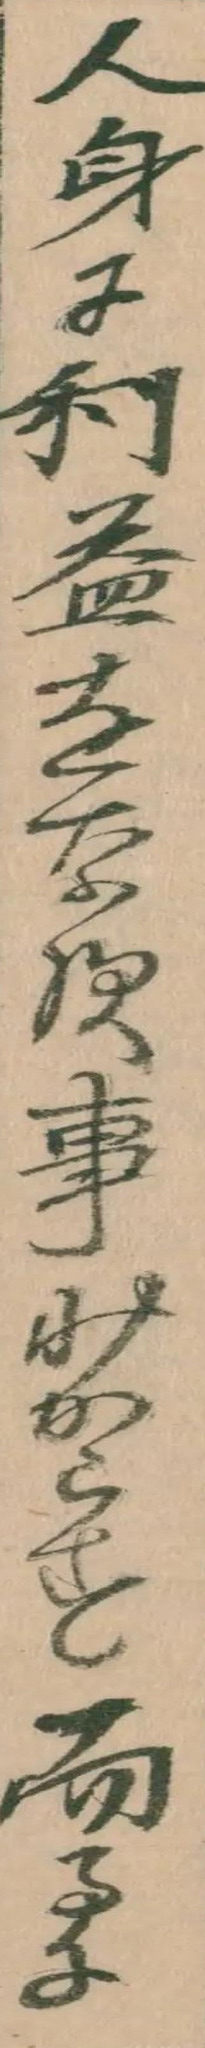人身に利益をなす事少からす而るに
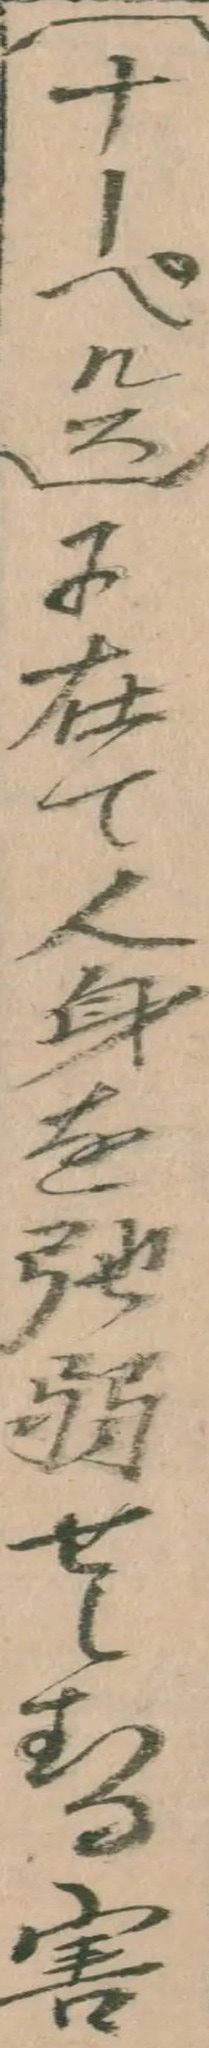(ナーペルス)に在て人身を弛弱せしむる害
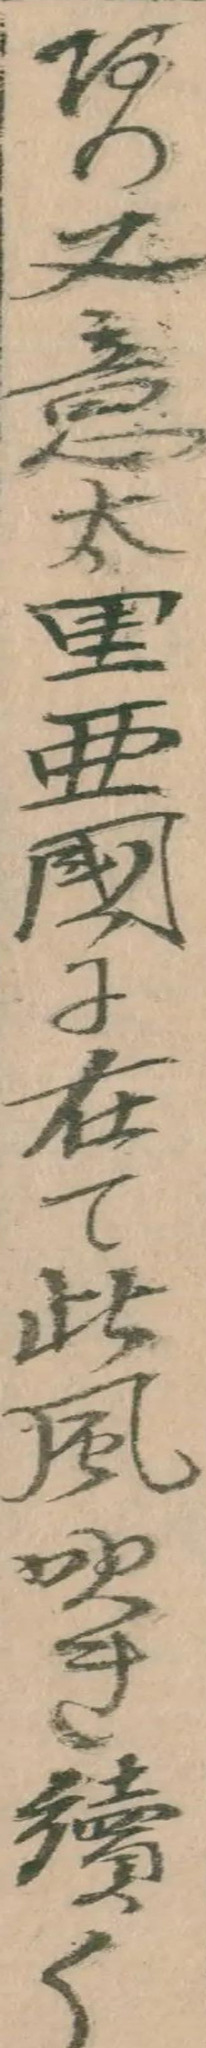あり又意太里亜国に在て此風吹き続く
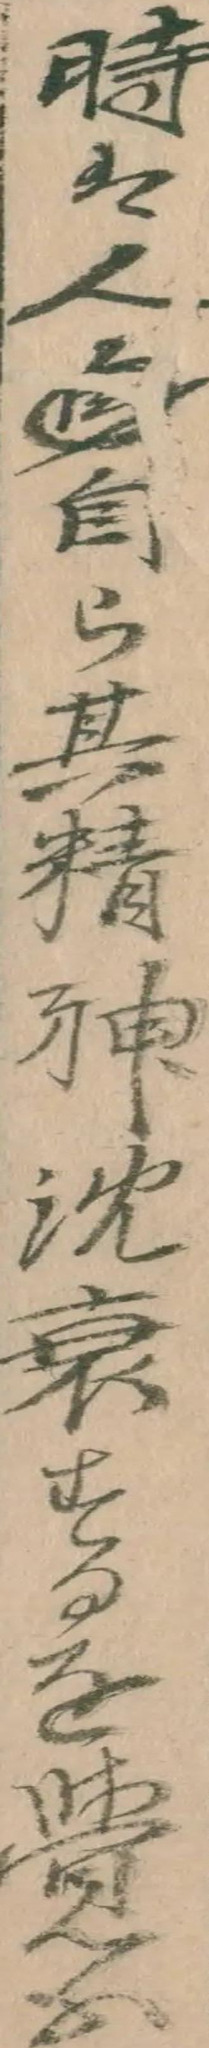時は人自ら其精神沈衰するを覚ふ
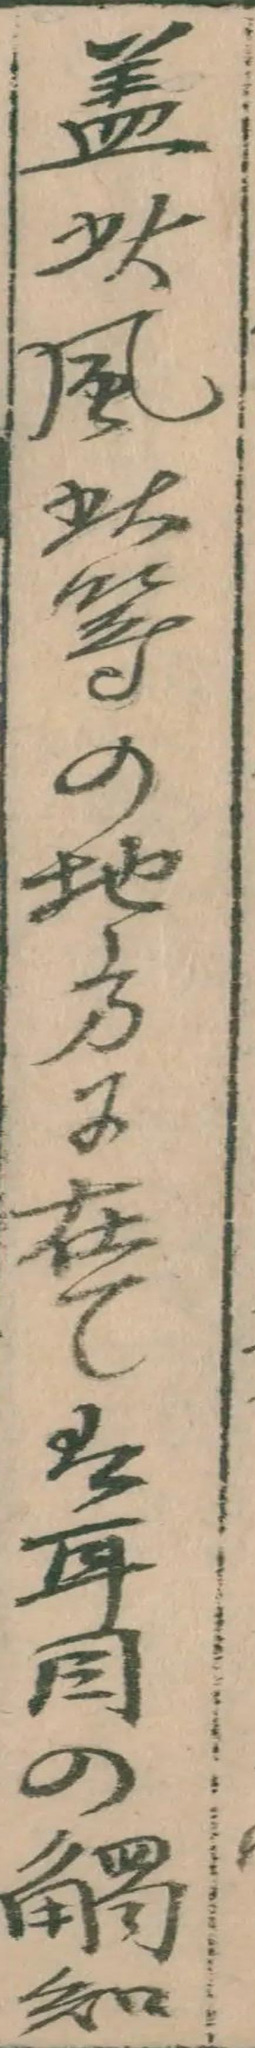蓋此風此等の地方に在ては耳目の触知

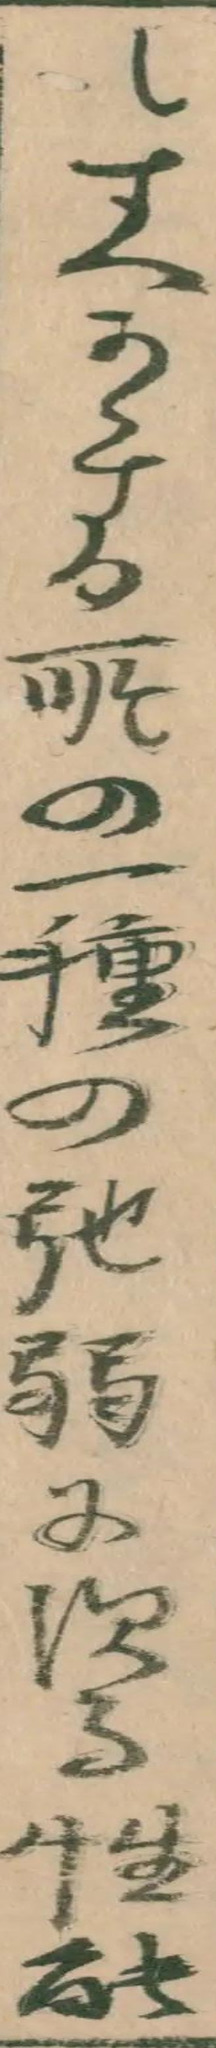しすへからさる所の一種の弛弱にする性能
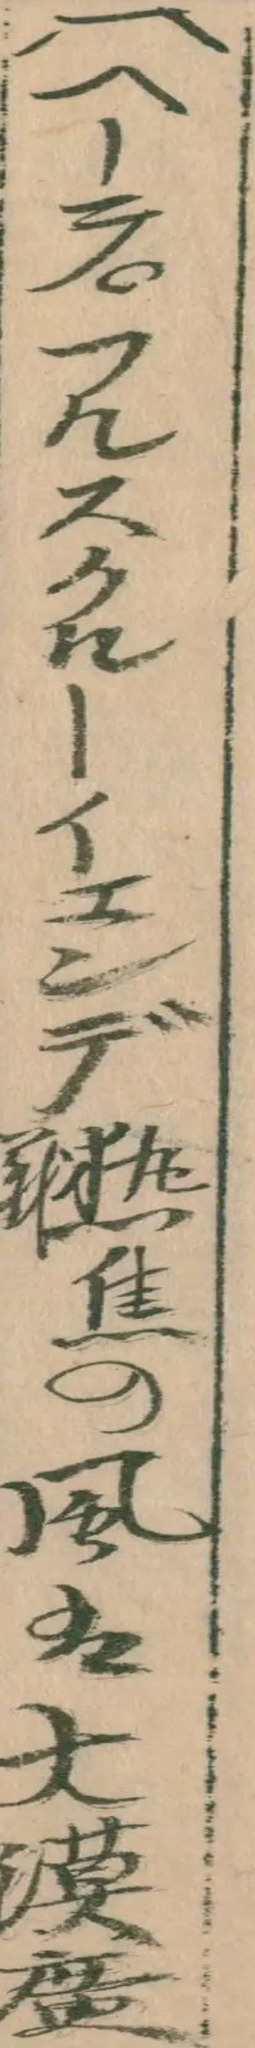(ヘーテ・フルスクルーイエンデ熱焦の義風は大漠広
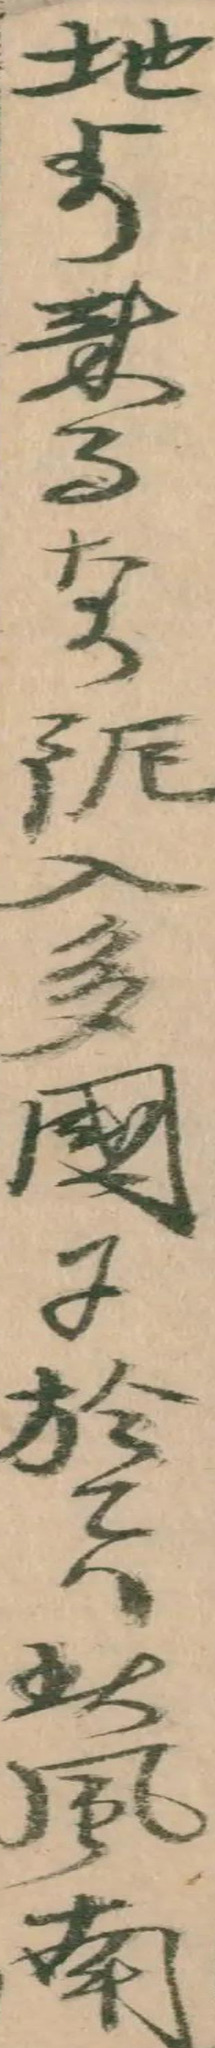地より来るなり阨入多国に於ては此風南
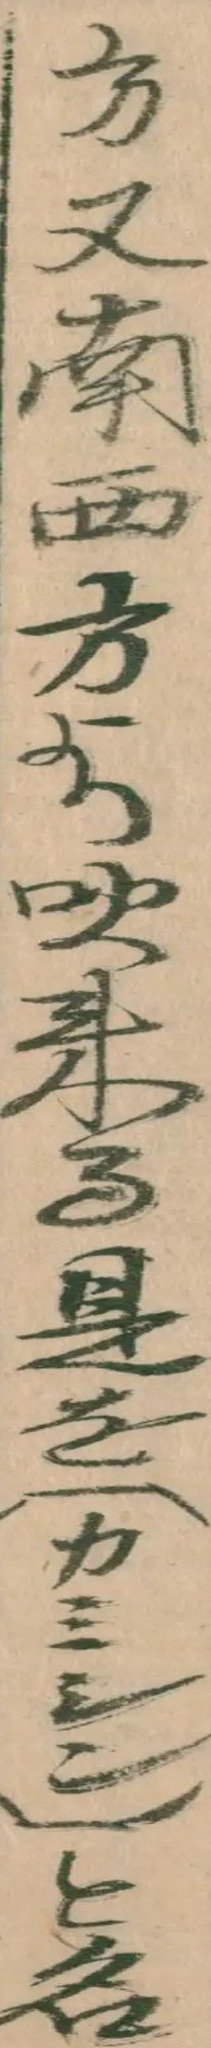方又南西方より吹来る是を(カミシン)と名
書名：新釈輿地図説
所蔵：国立国会図書館 National Diet Library, JAPAN
